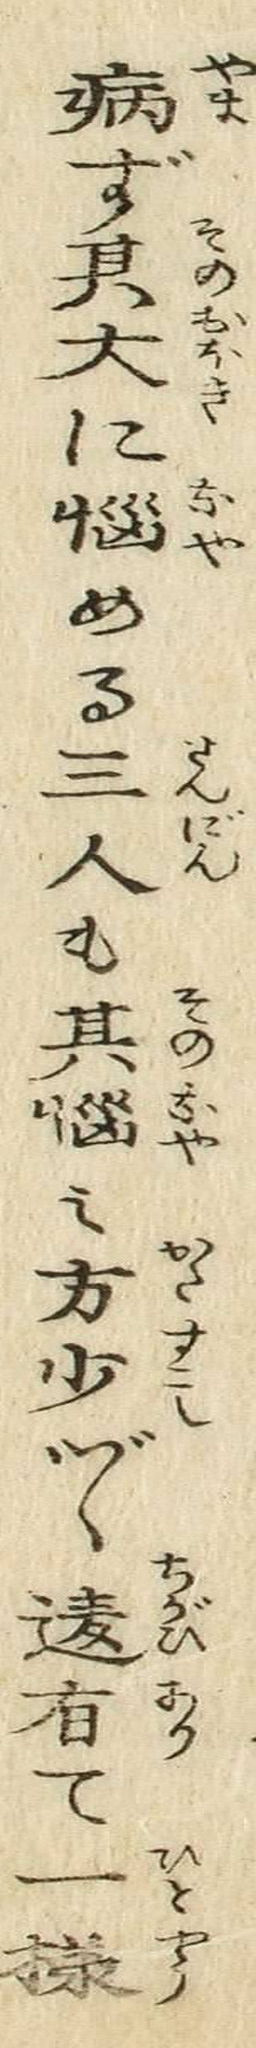病ず其大に悩める三人も其悩み方少づゝ違有て一様
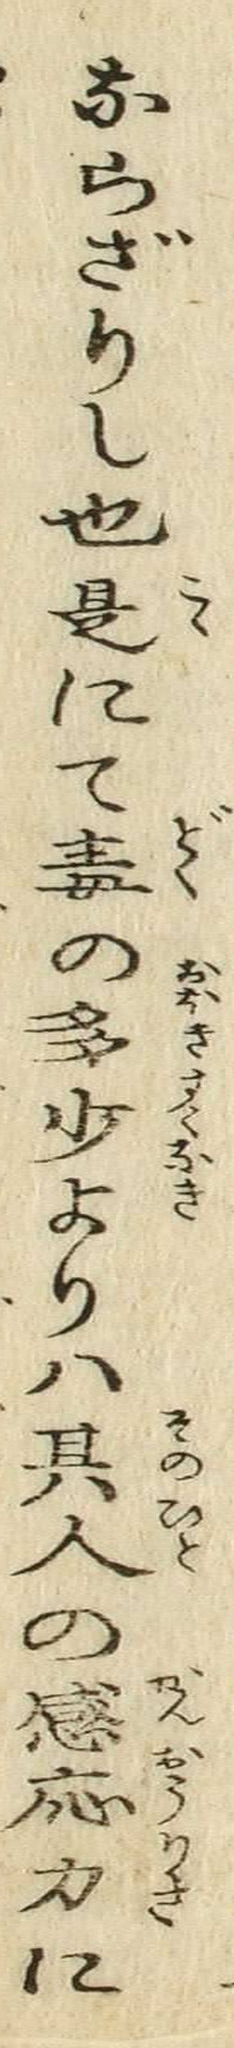ならざりし也是にて毒の多少よりは其人の感応力に
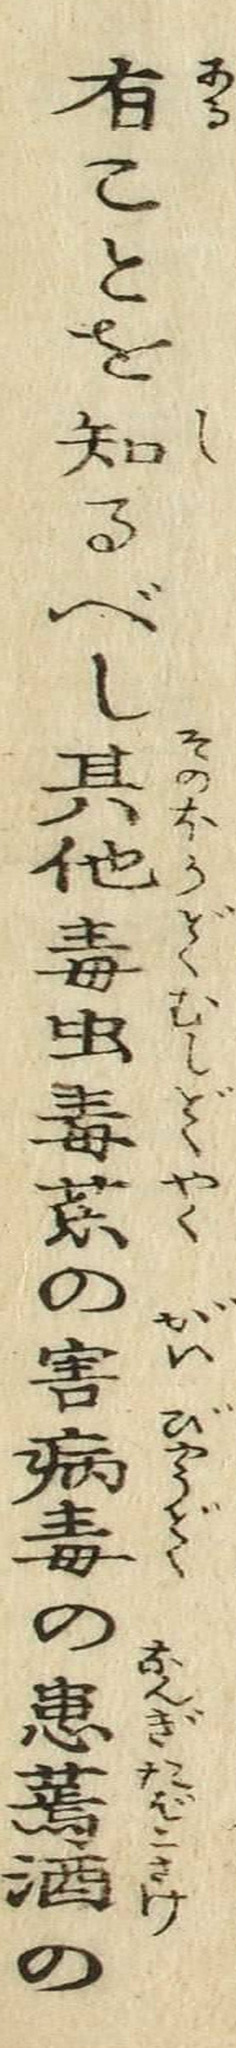有ことを知るべし其他毒虫毒葯の害病毒び患蔫酒の

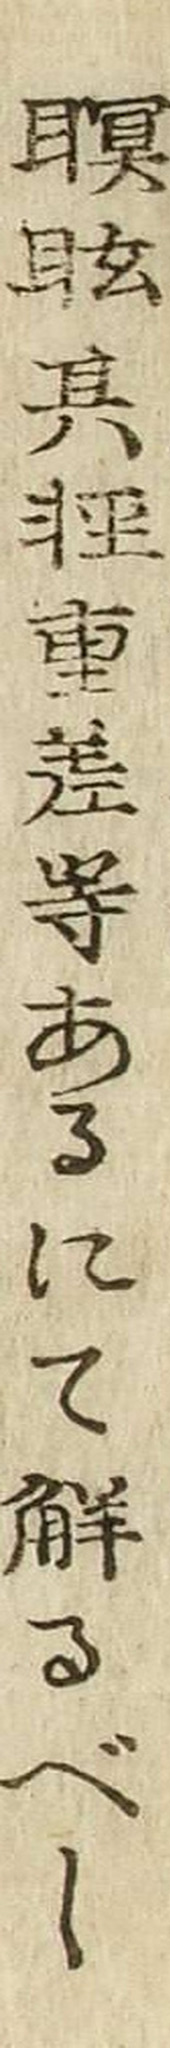䏃𦕇其軽重差等あるにて觧るべし
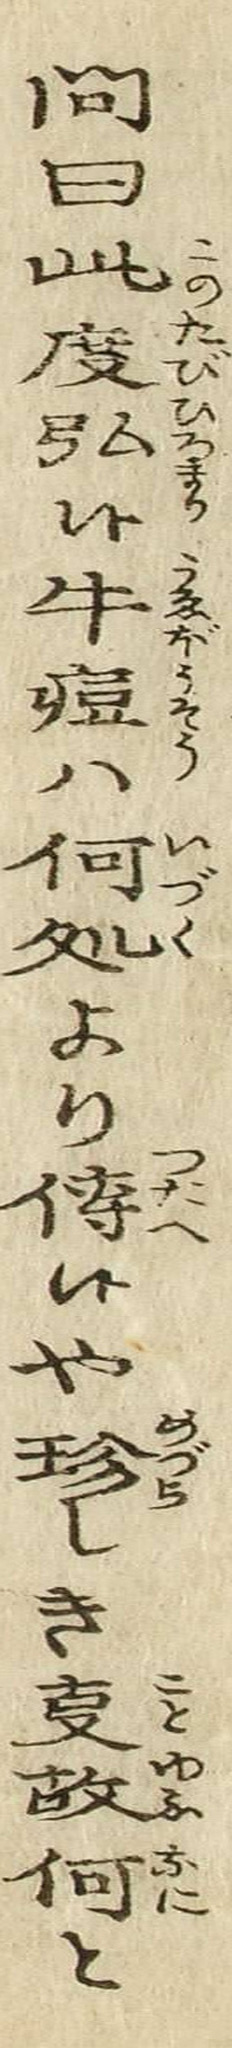問曰此度弘候牛痘は何処より傳候や珍しき㕝故何と
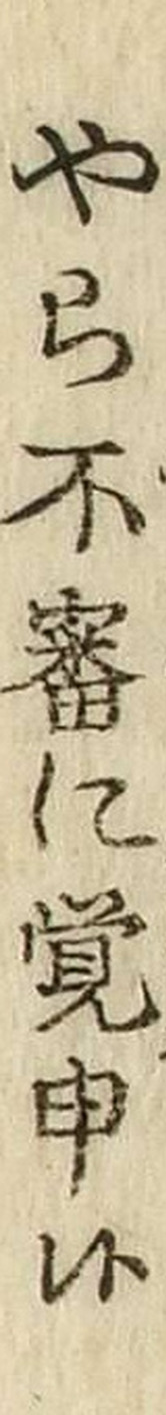やら不審に覚申候
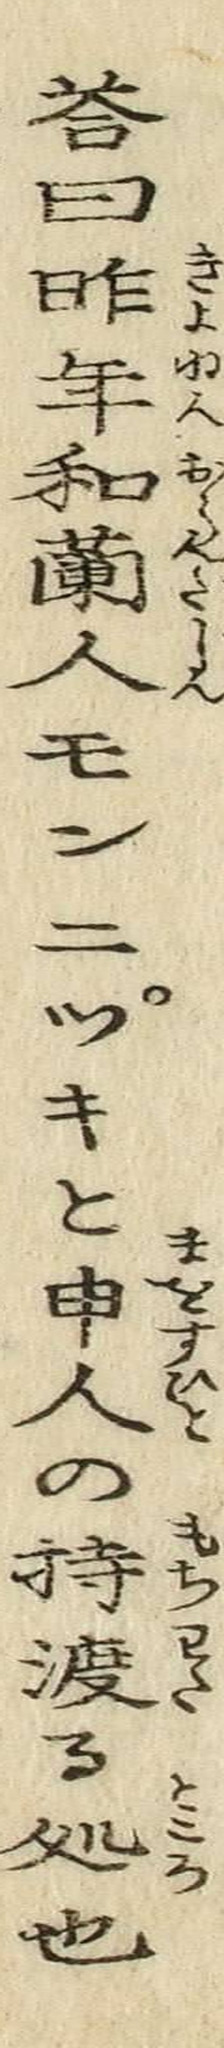答曰昨年和蘭人モンニツキと申人の持渡る処也
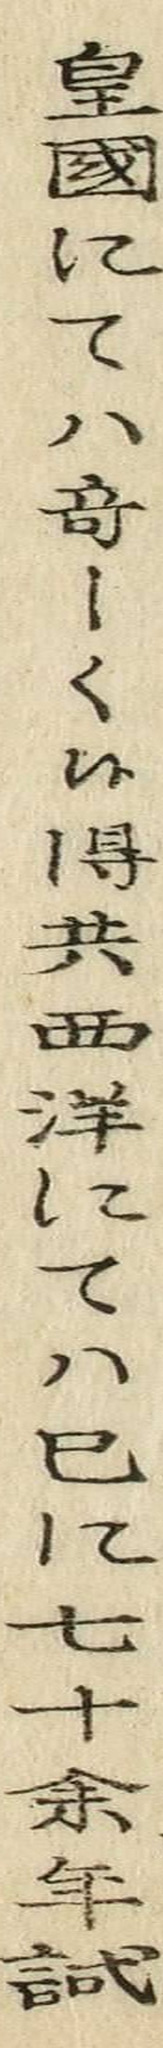皇國にては奇しく候得共西洋にては已に七十余年試
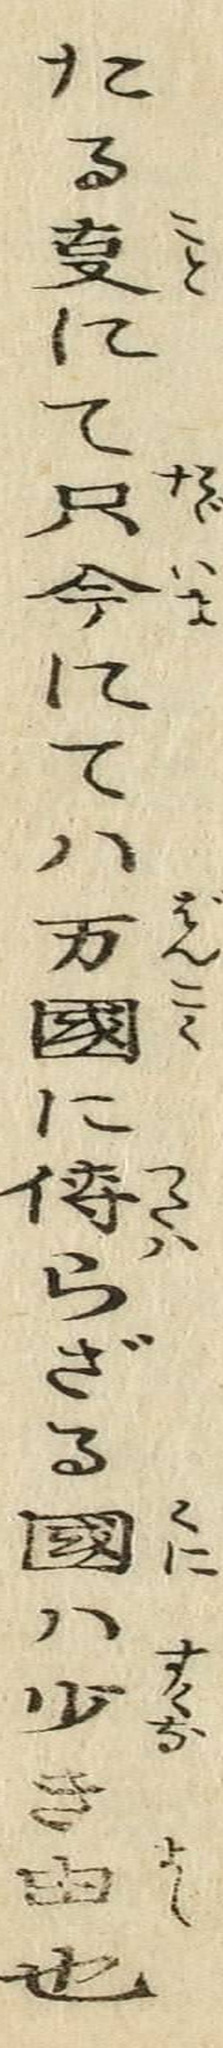たる㕝にて只今にては万國に傳らざる國は少き由也
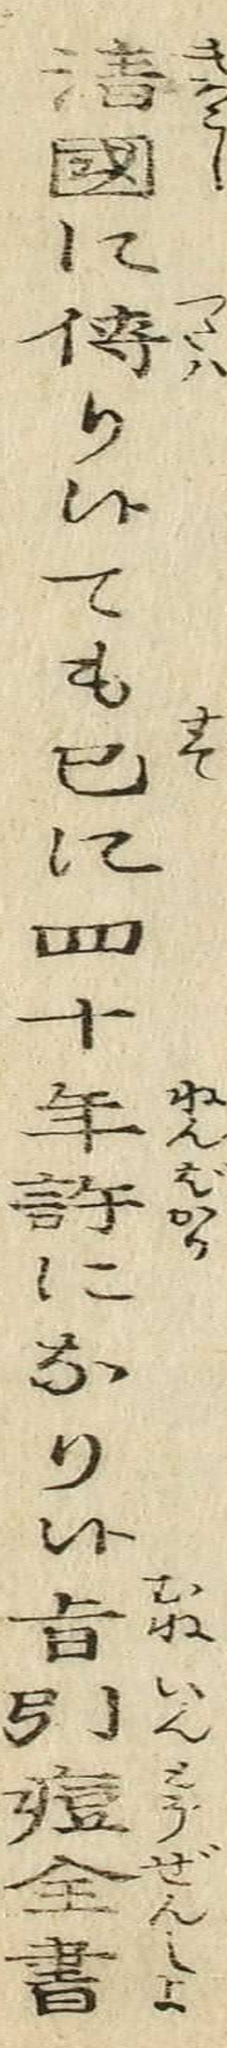清國に傳り候ても已に四十年許になり候旨引痘全書
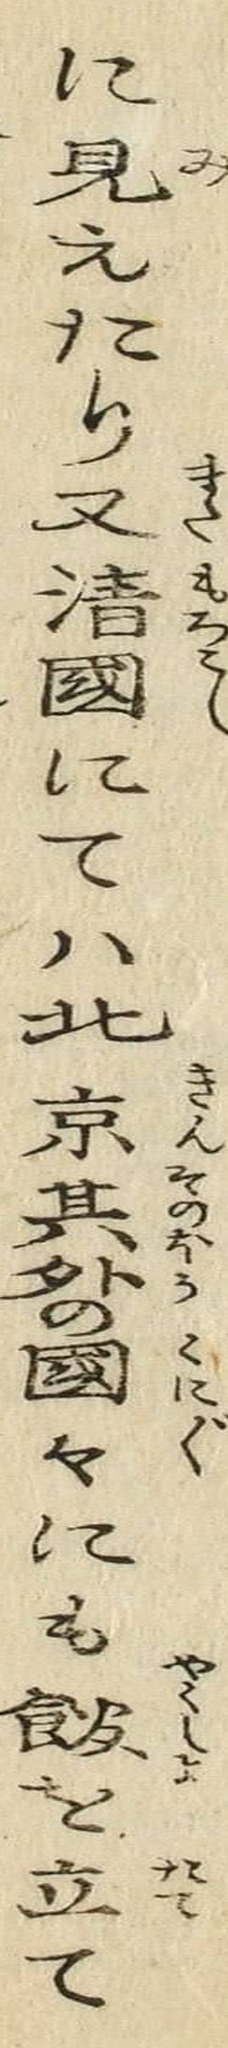に見えたり又清國にては北亰其他の國々にも飯を立て
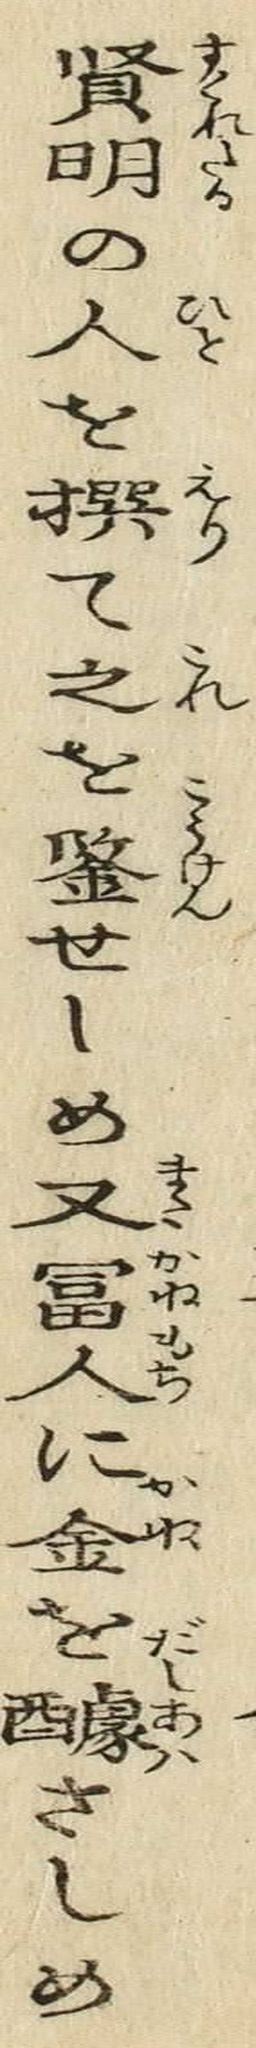賢明の人を撰て之を貢せしめ又富人に金を醵さしめ
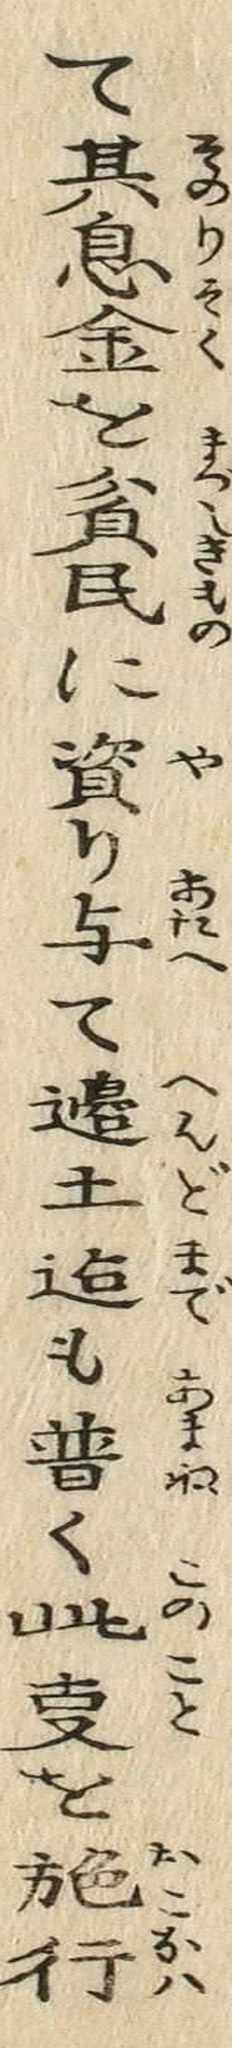て其息金を貧民に資り与て邊土迄も普く此㕝を施行
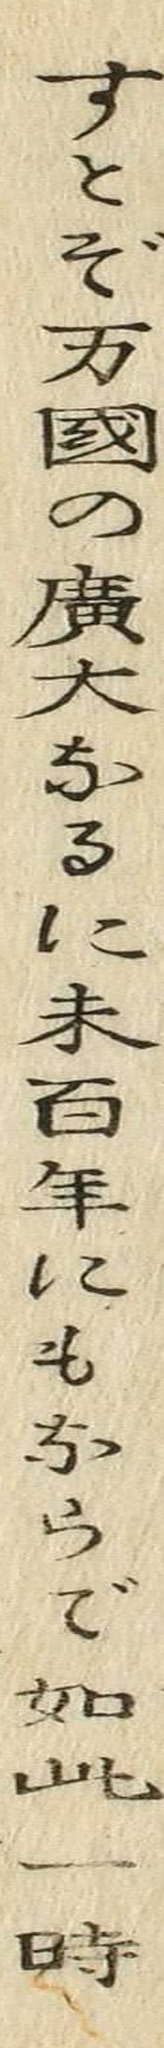すとぞ万國の廣大なるに未百年にもならで如此一時
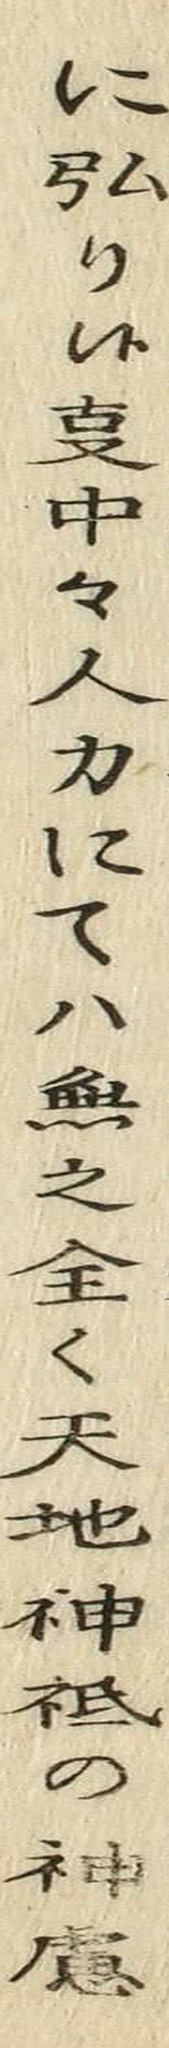に弘り候㕝中々人力にては無之全く天地神袛の神慮
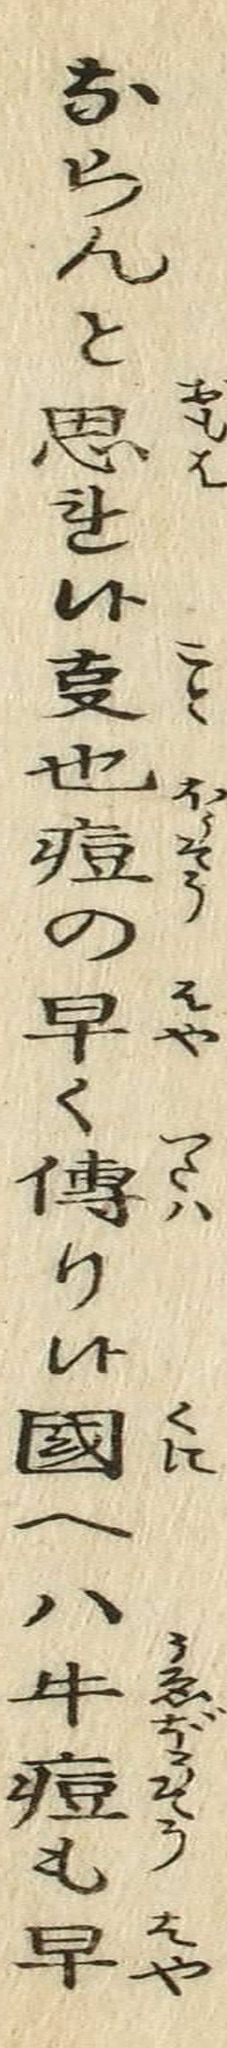ならんと思れ候㕝也痘の早く傳り候國へは牛痘も早
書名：牛痘問答
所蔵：九州大学医学図書館 国文学研究資料館
